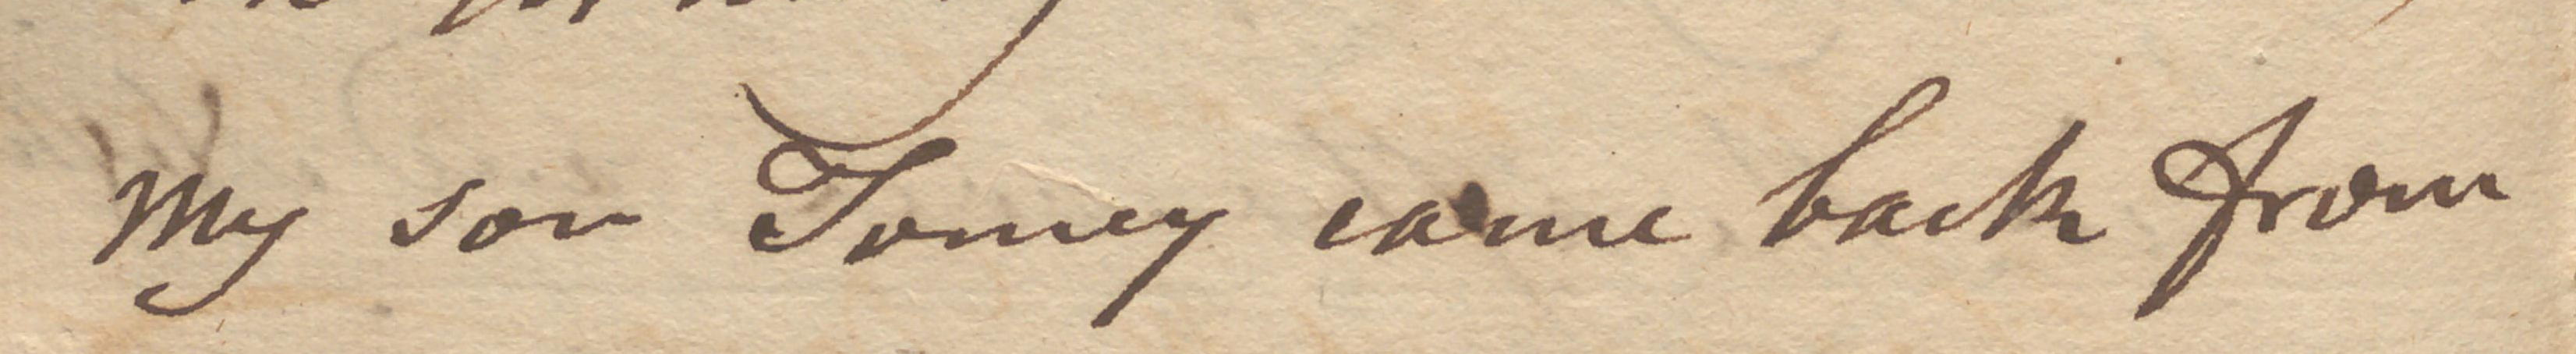My son Tomey came back from
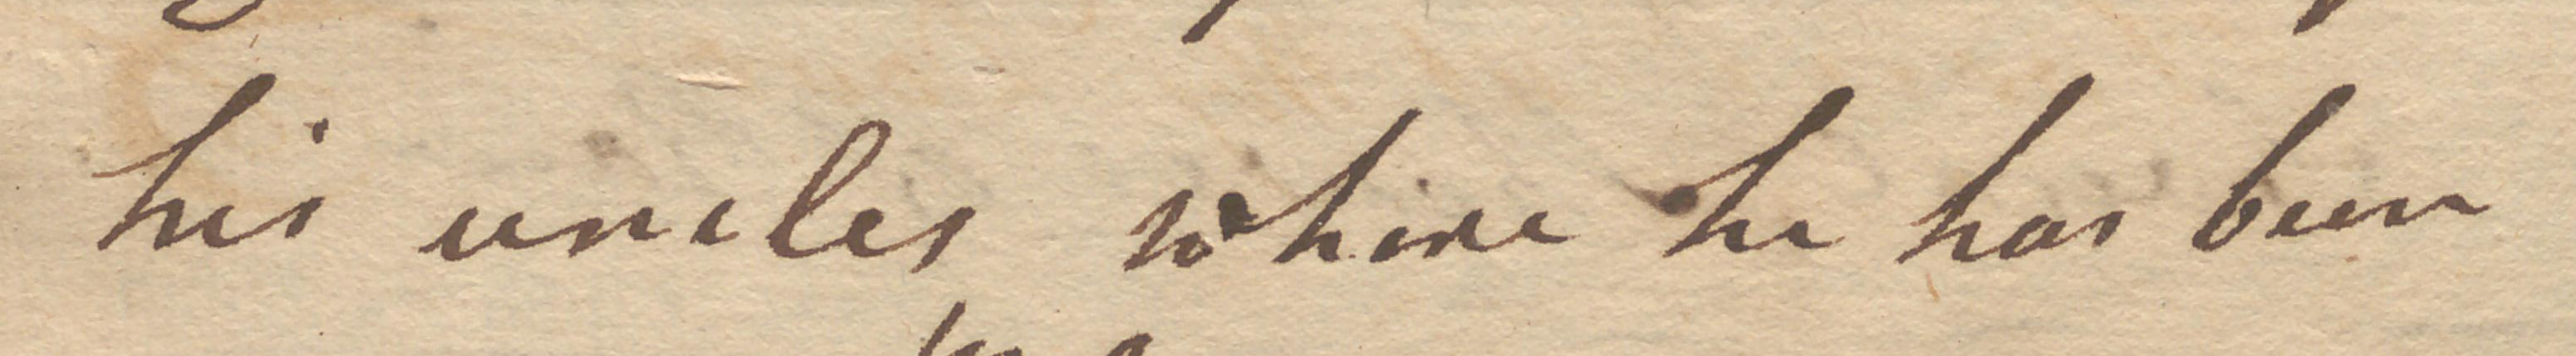his uncles where he has been
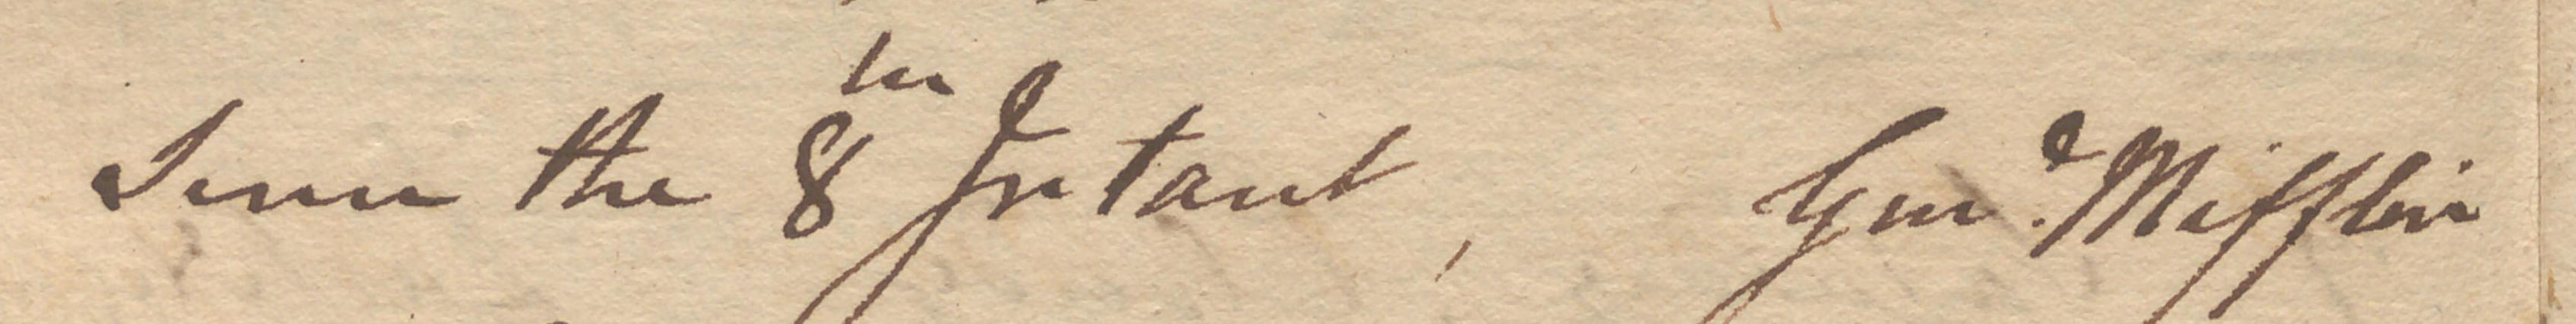since the 8^th Intant Gen^l. Mifflin
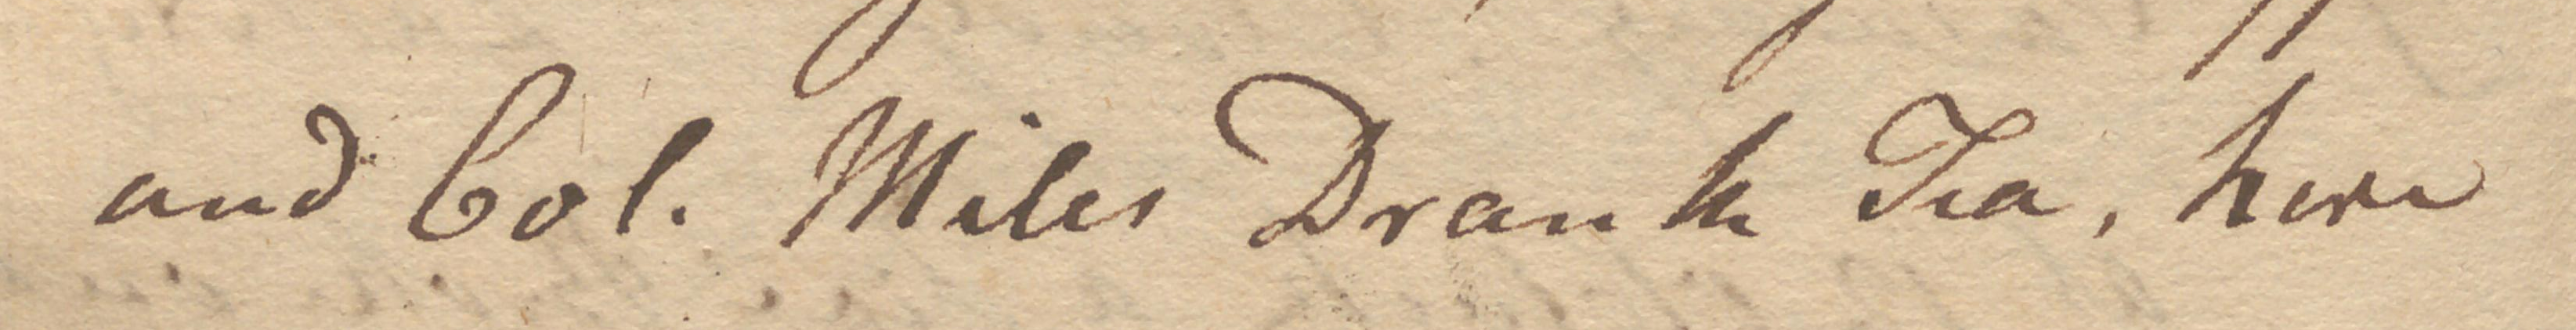and Col. Miles Drank Tea, here
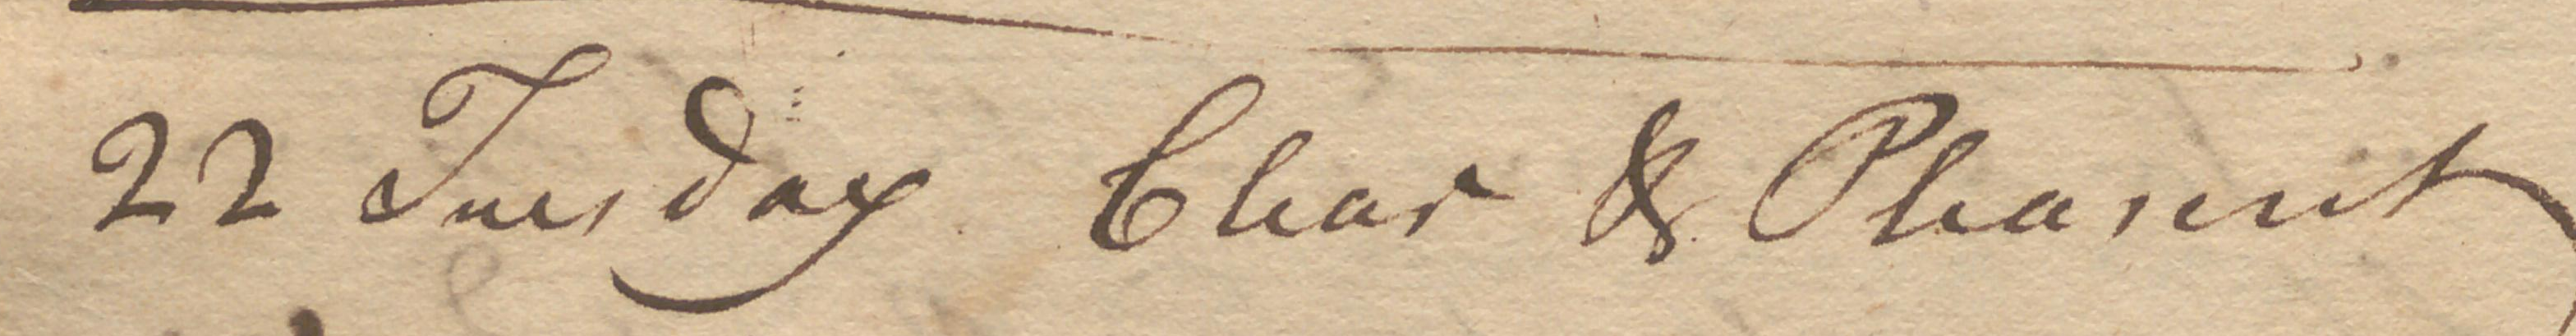22 Tuesday. Clear & Pleasent
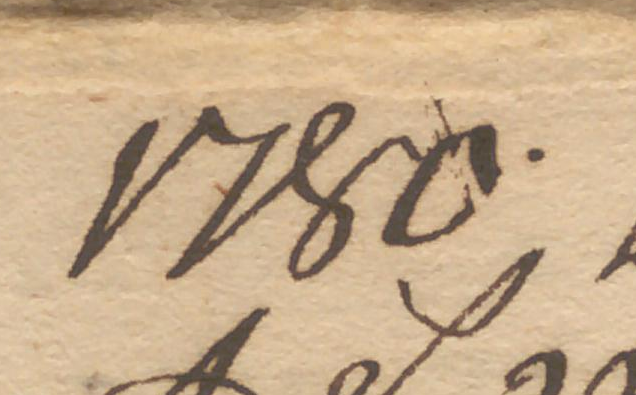1780
